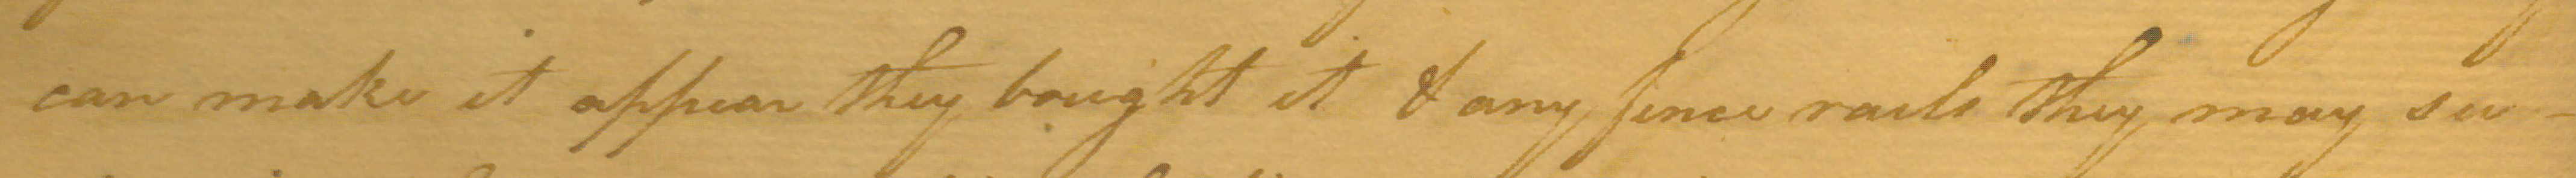can make it appear they bought it & any fence rails they may see
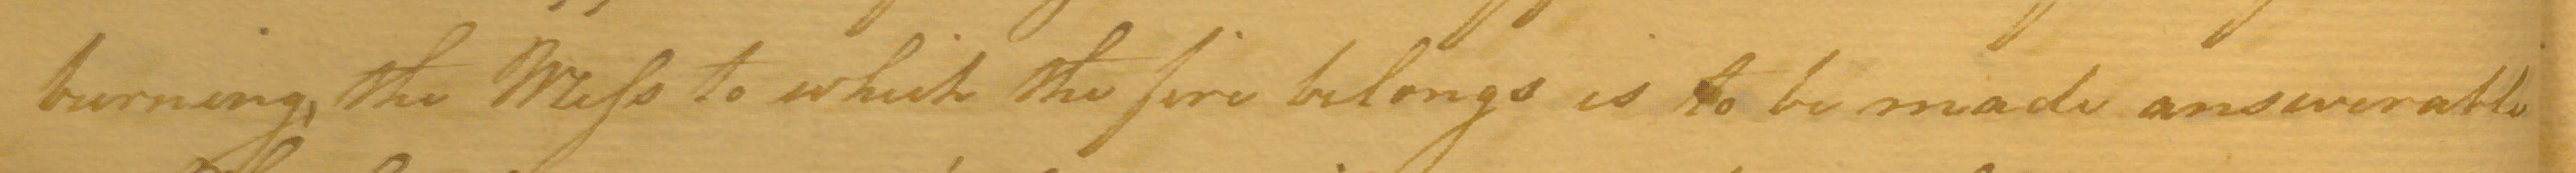burning the Mess to which the fire belongs is to be made answerable
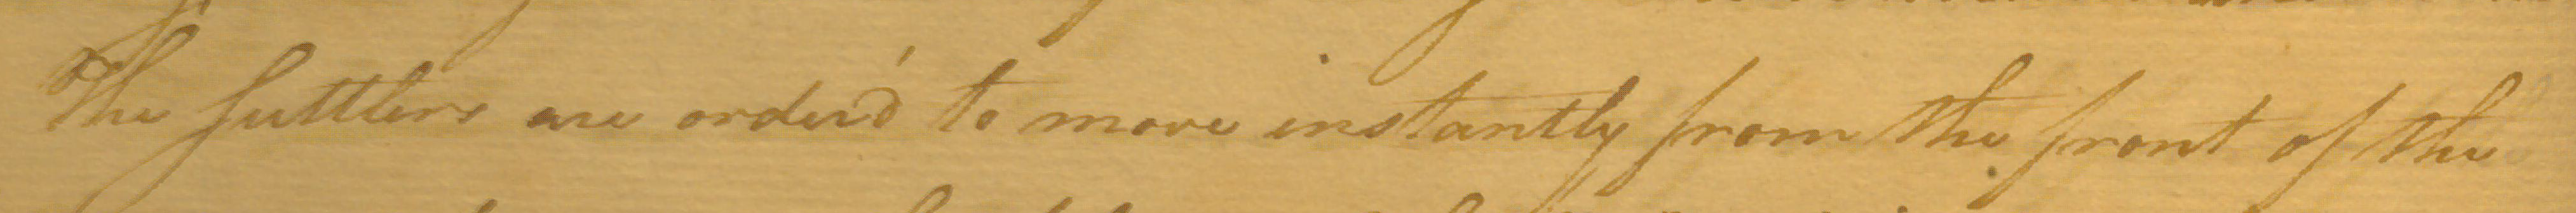The settlers are order'd to move instantly from the front of the
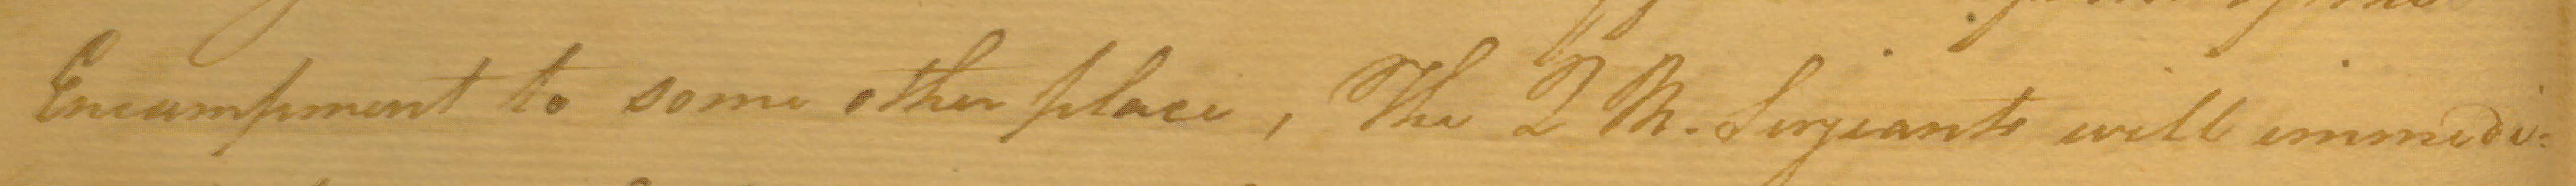Encampment to some other place, The Q. M. Serjeants will immedi-
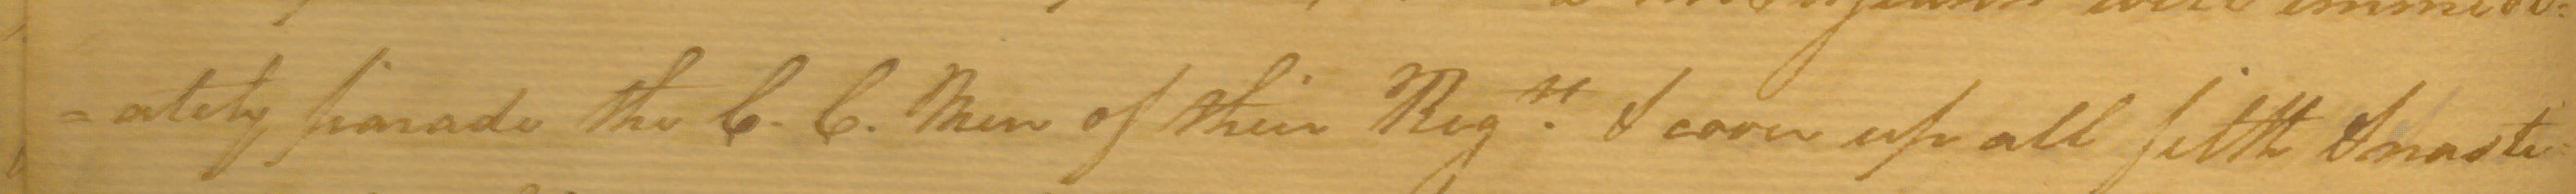ately parade the C. C. Men of their Reg^ts. & cover up all filth & nasti
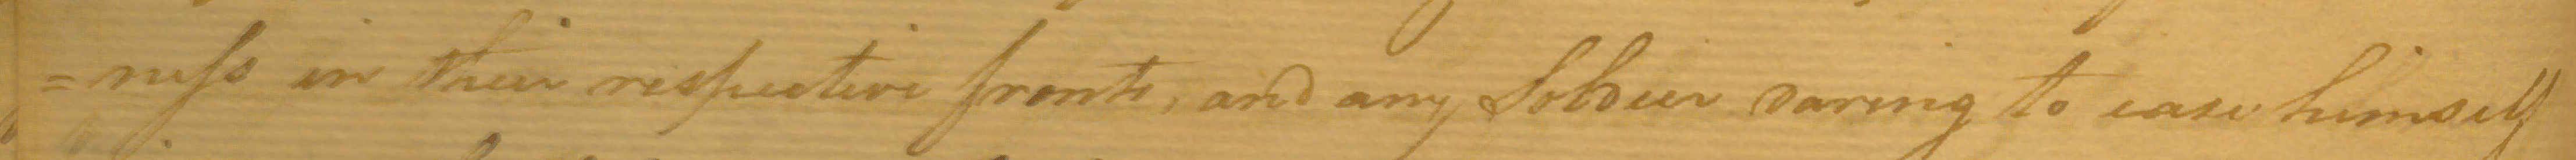-ness in their respective fronts, and any Soldier daring to ease himself
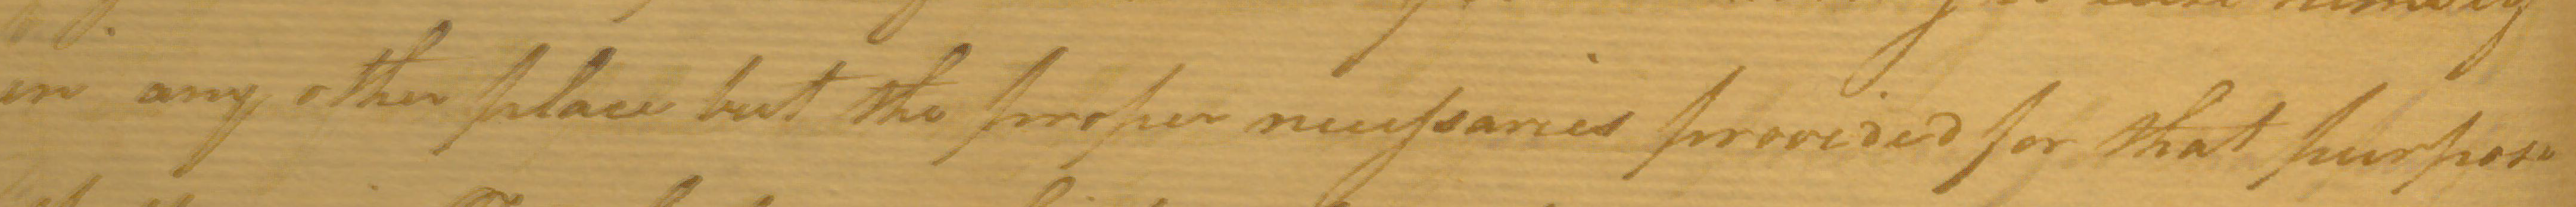in any other place but the proper necessaries provided for that purpose
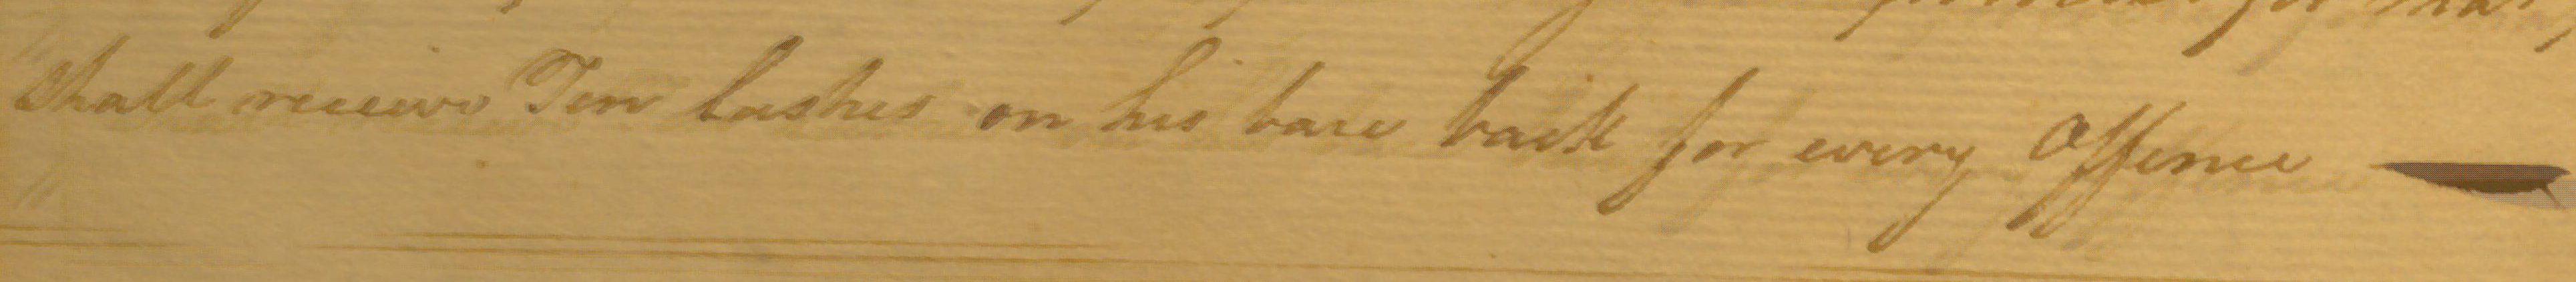shall receive Ten lashes on his bare back for every Offence-
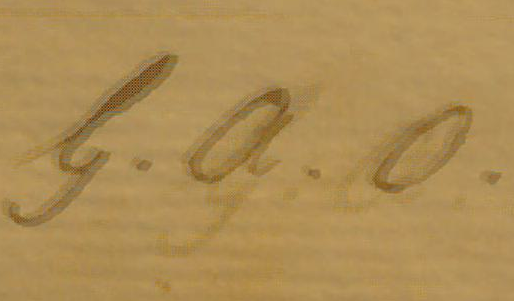G. A. O.
